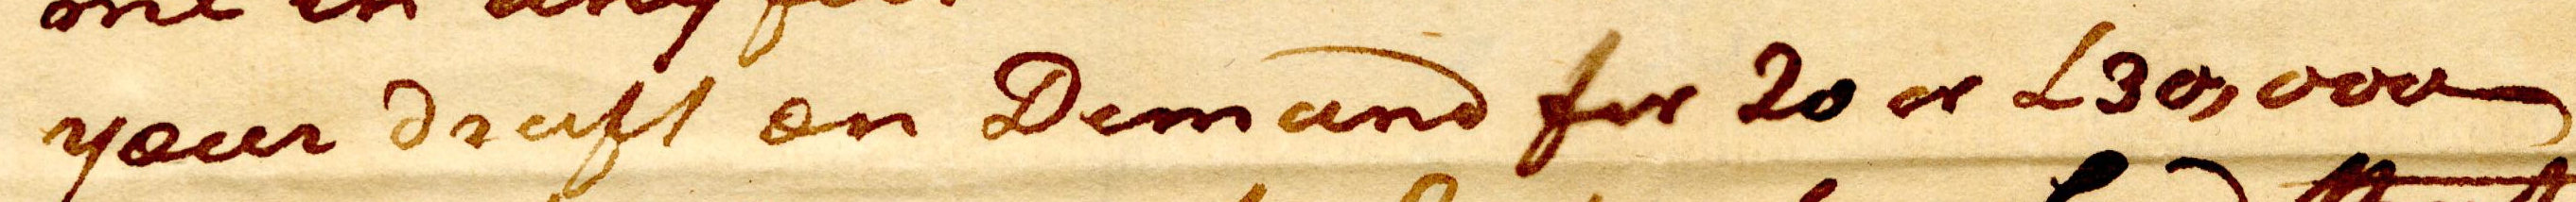your draft on Demand for 20 or £30,000
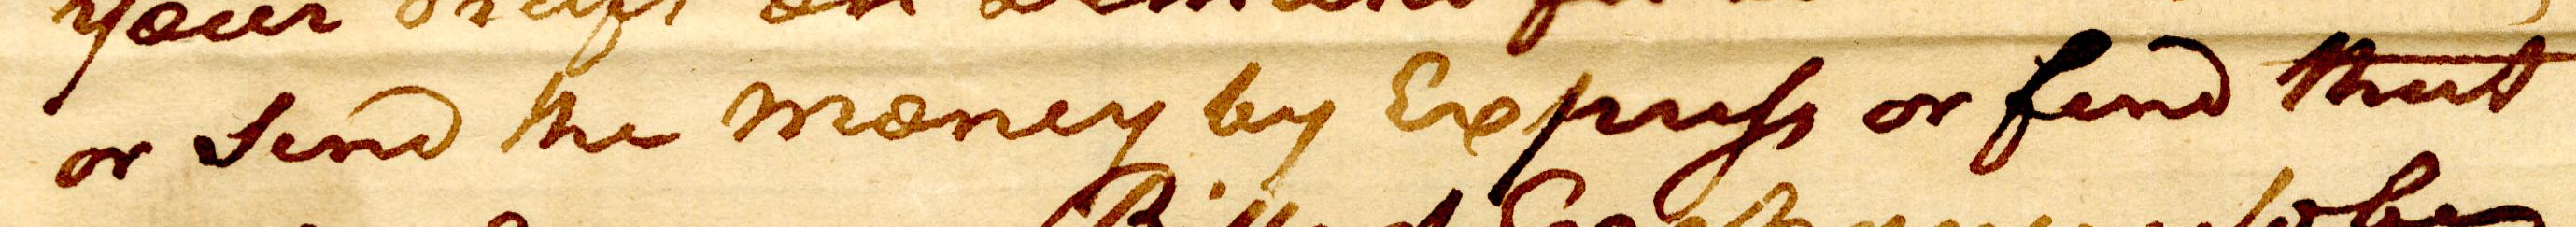or send the money by Express or find that
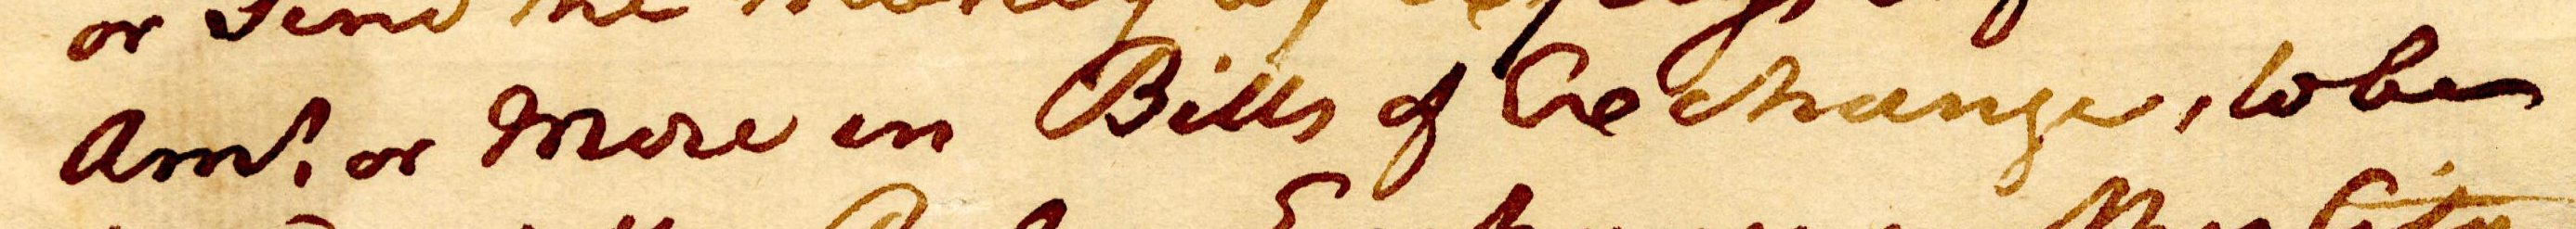Am^t. or More in Billls of Exchange, when
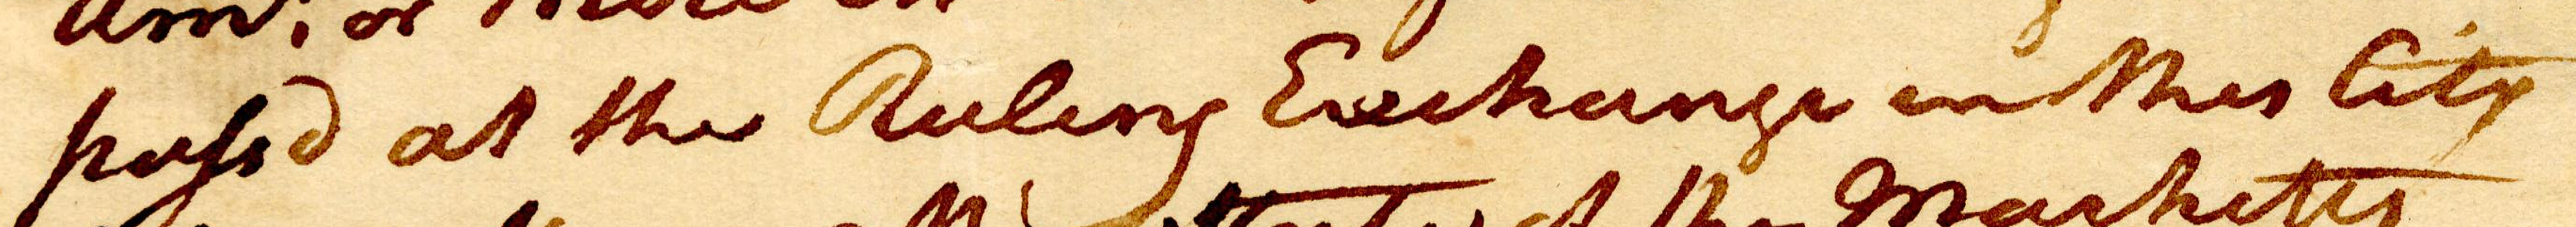pass'd at the Ruling Exchange in this city
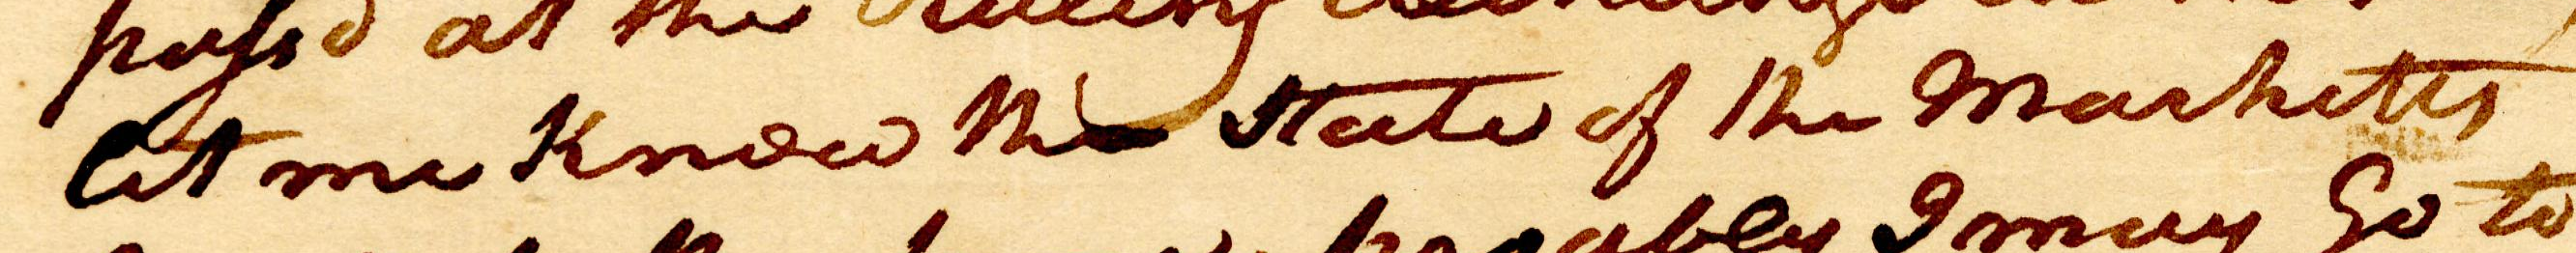let me Know the streets of the Merchants
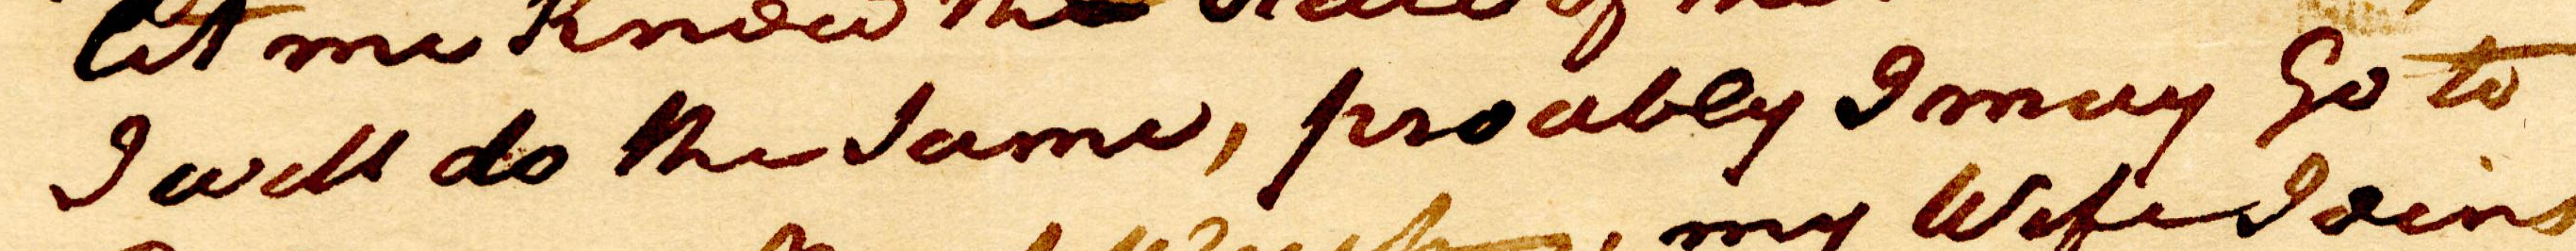I will do the Same, proably I may go to
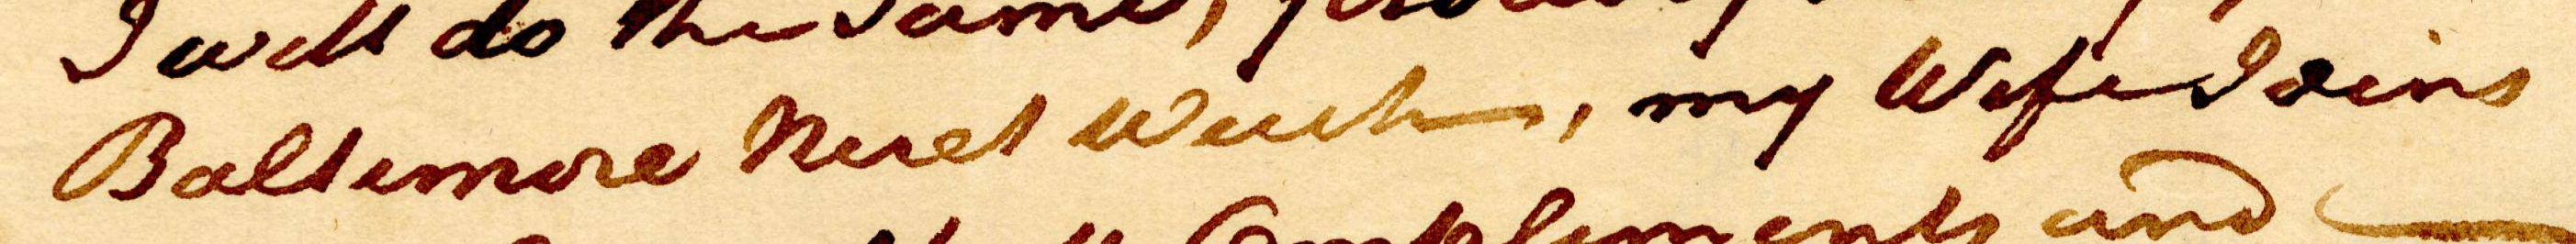Baltimore Next week, my Wife joins
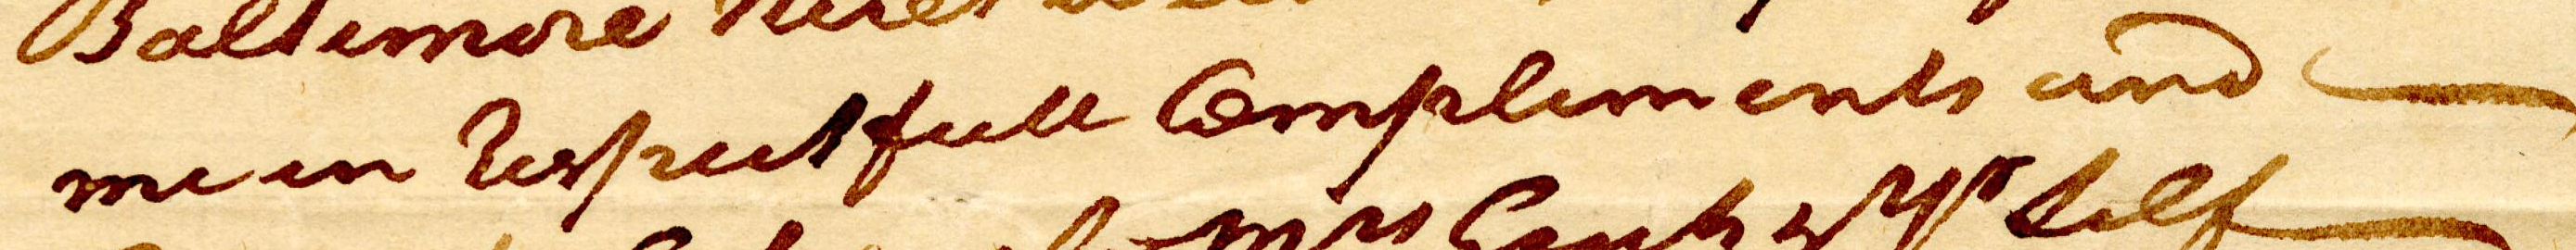me in respectful complements and-
